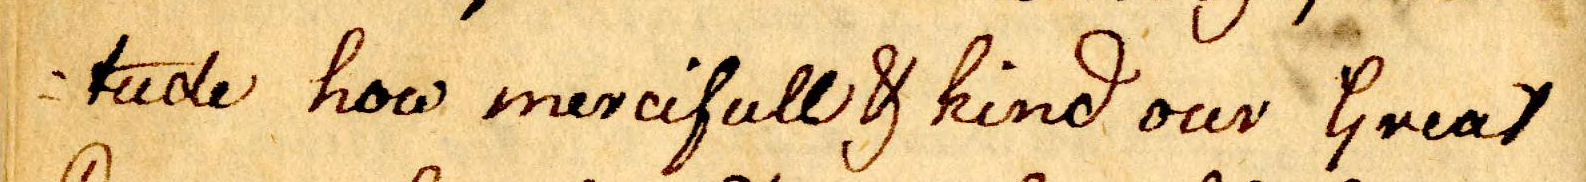-tude how mercifull & kind our Great
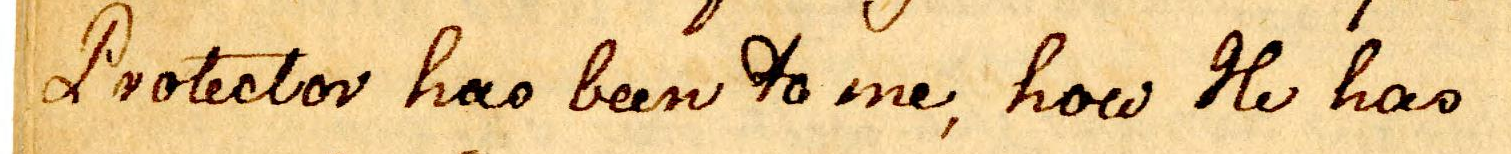Protector has been to me, how He has
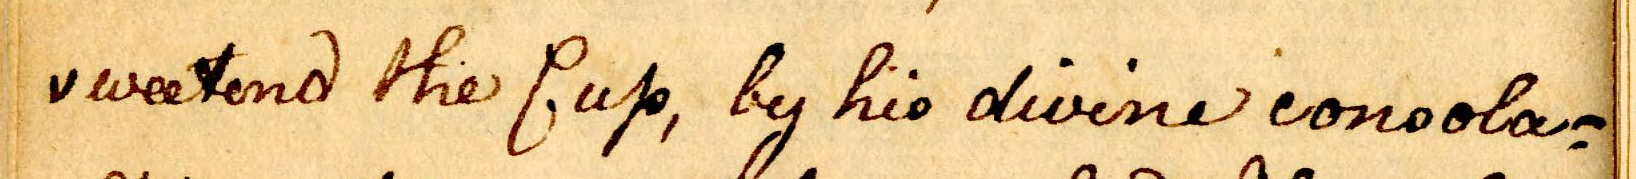sweetend the Cup, by his divine consola-
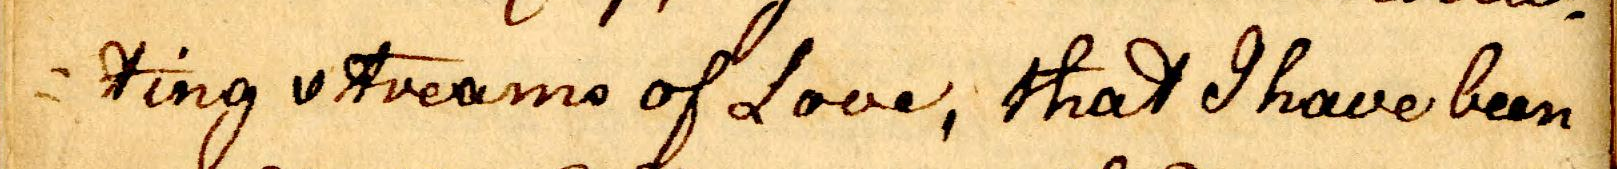-ting streams of Love, that I have been
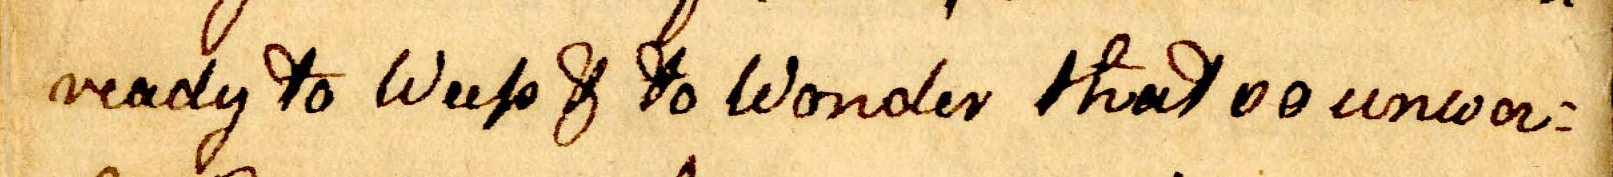ready to Weep & to Wonder that so unwor-
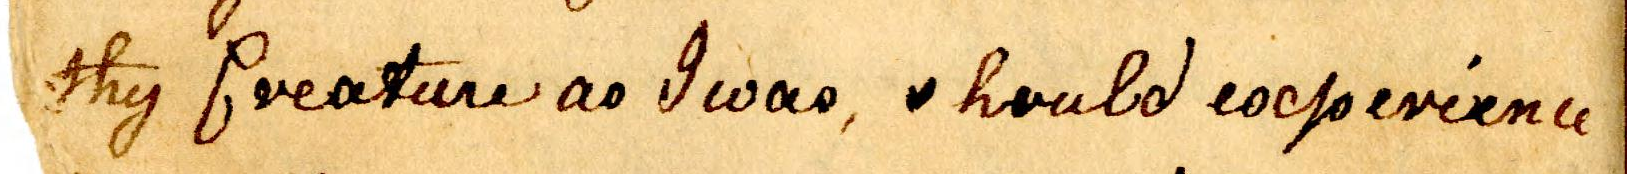thy Creature as I was, should experience
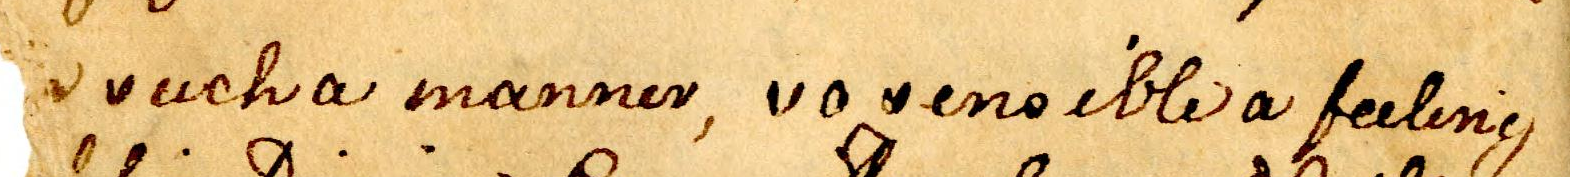such a manner, so sensible a feeling
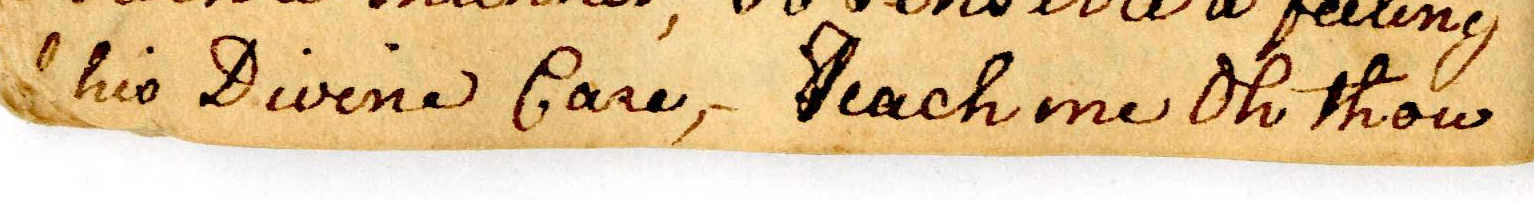his Divine Care,- Teach me Oh thou
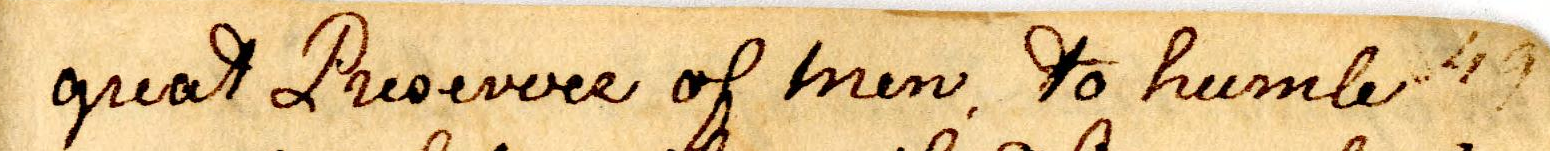great Preserver of men to humle
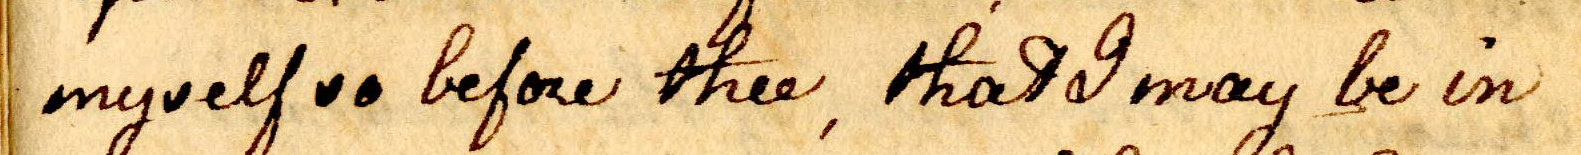myself so before thee, that I may be in
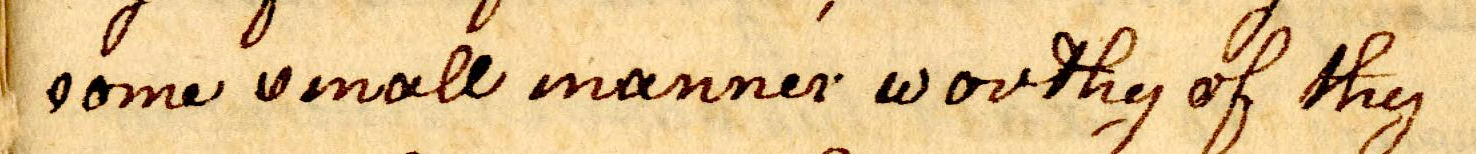some small manner worthy of thy
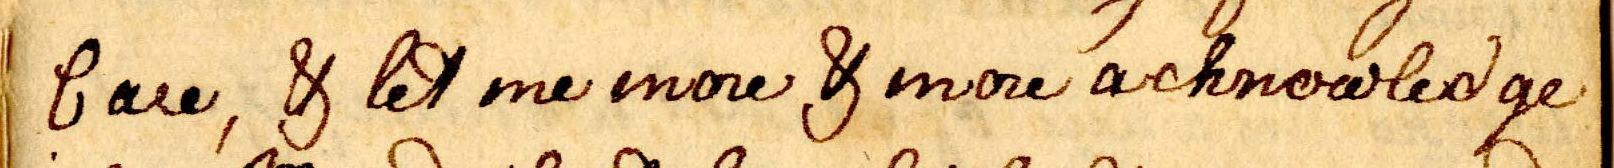Care, & let me more & more acknowledge
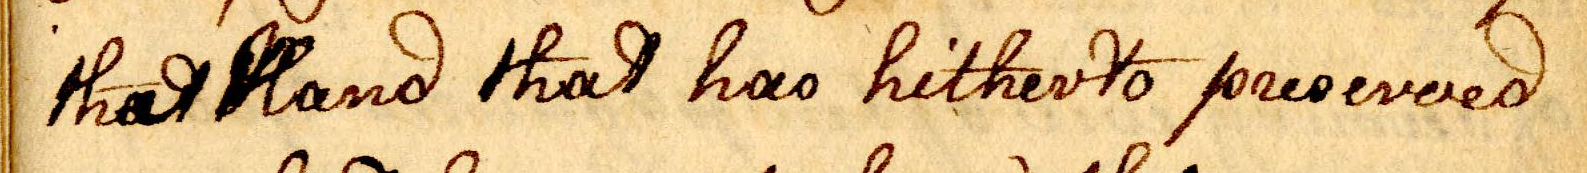that Hand that has hither to preserved
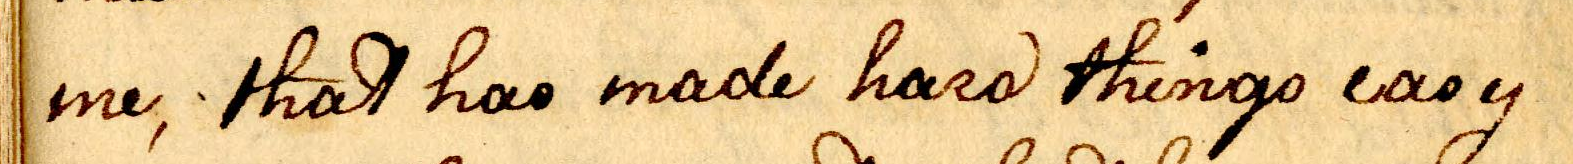me, that has made hard things easy
